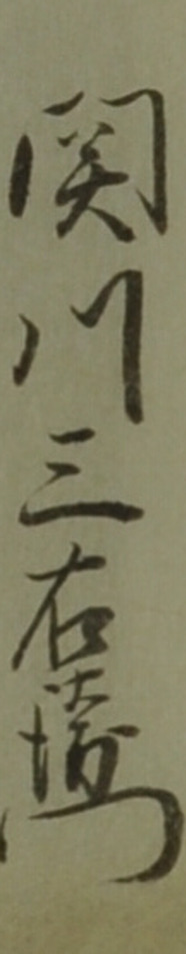関川三右衛門
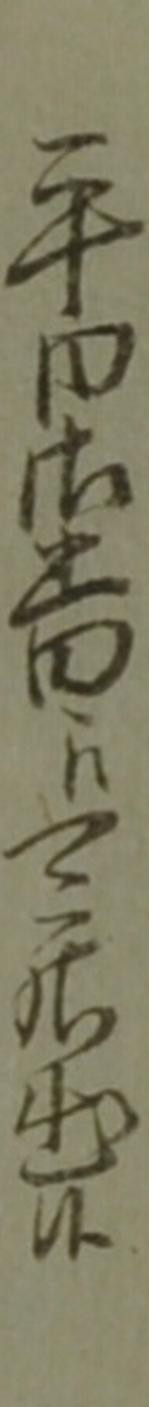平日御番江可罷出候
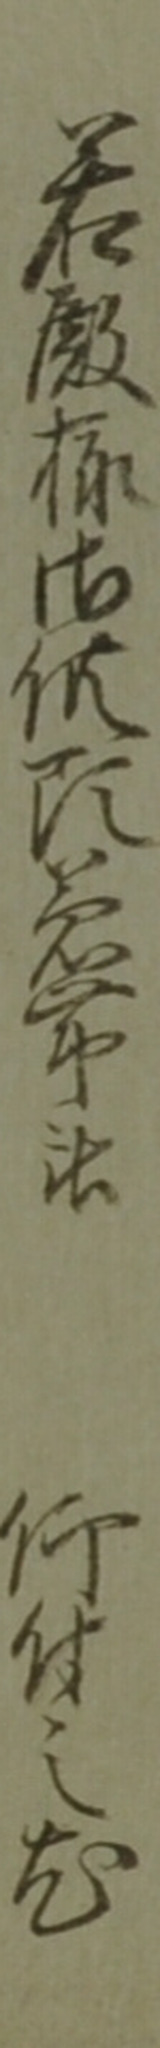若殿様御供頭兼帯被仰付之尤
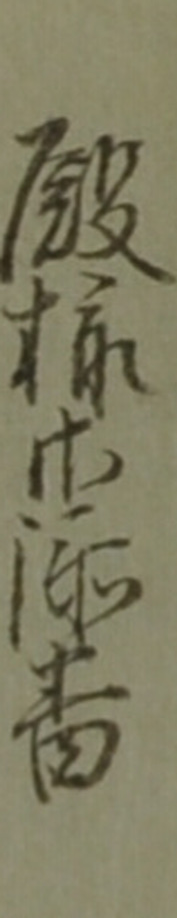殿様御添番
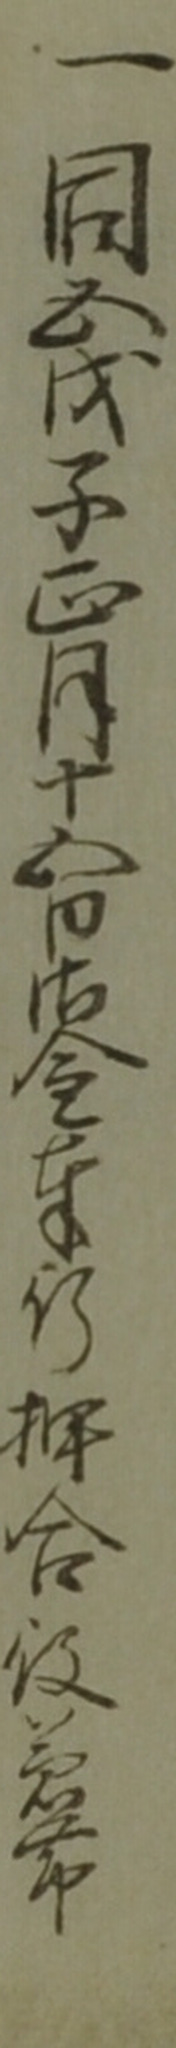一同五戊子正月十五日御金奉行押合役兼帯
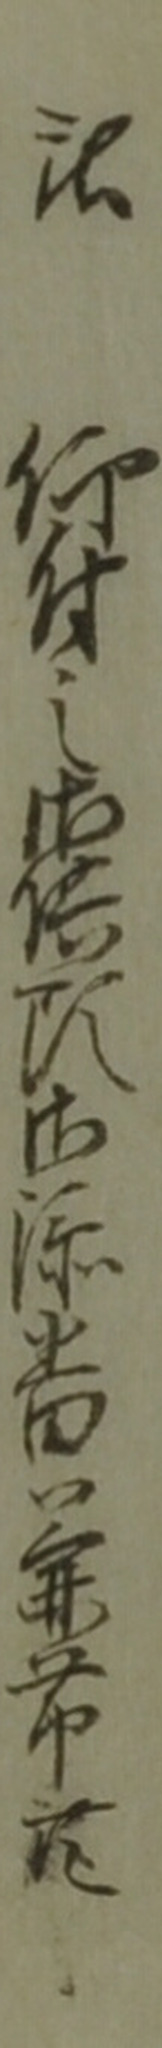被仰付之御供頭御添番兼帯共
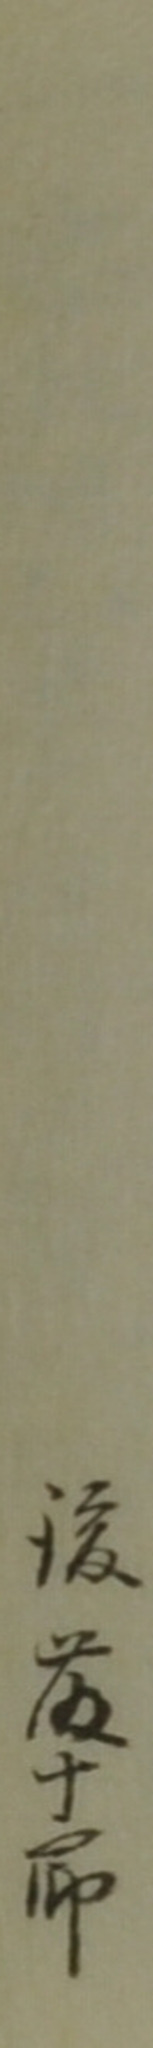後藤十郎
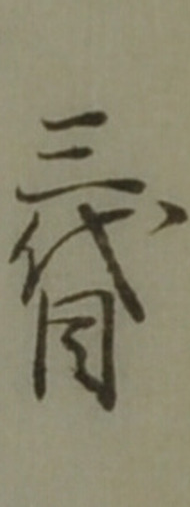三代目
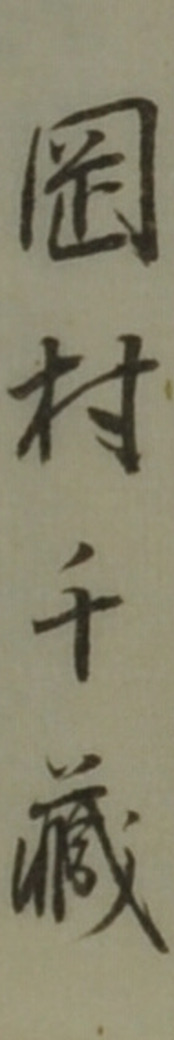岡村千蔵
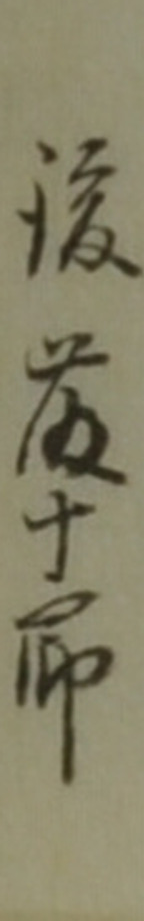後藤十郎
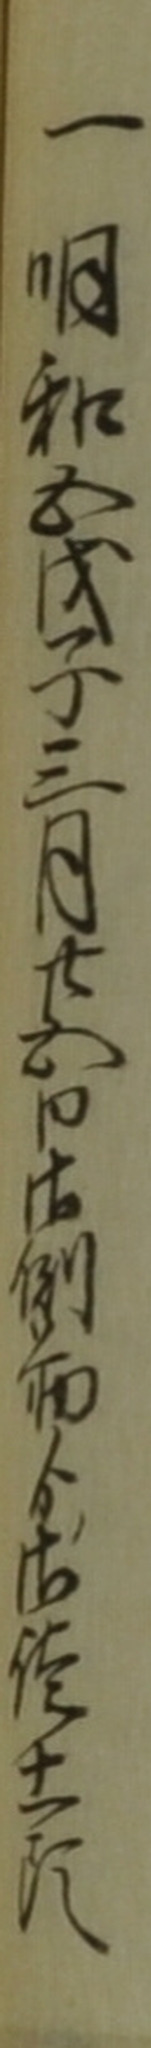一明和五戊子三月廿五日御側勤ゟ御徒士頭
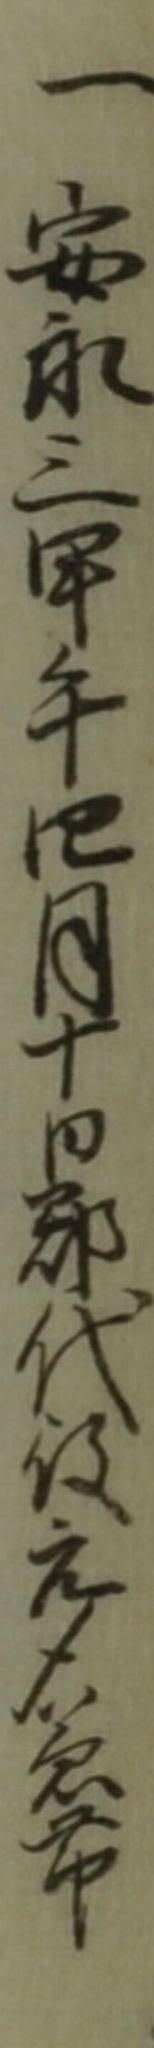一安永三甲午四月十日郡代役元〆兼帯
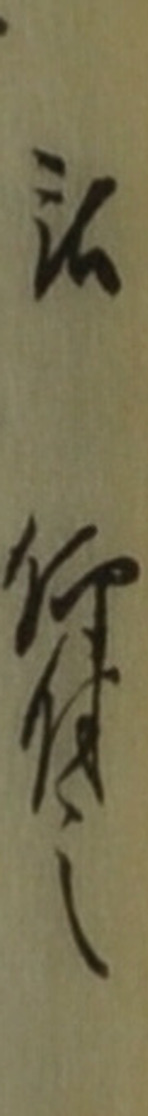被仰付之
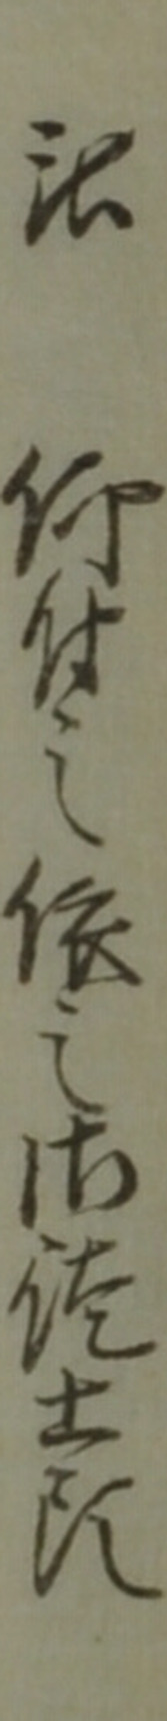被仰付之依之御徒士頭
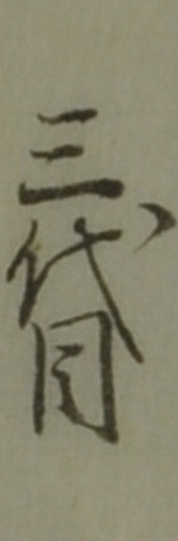三代目
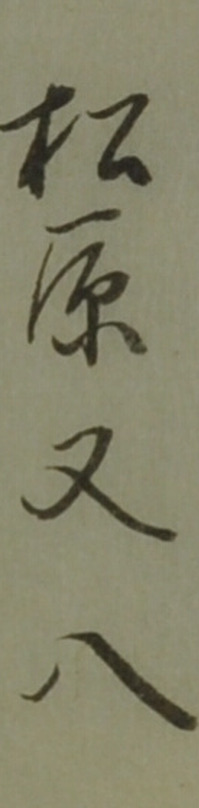松原又八
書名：諸御役代々録（六）
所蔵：伊那市立高遠町図書館・合同会社AMANE
